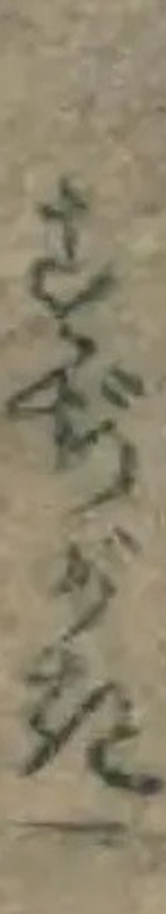すぢがき
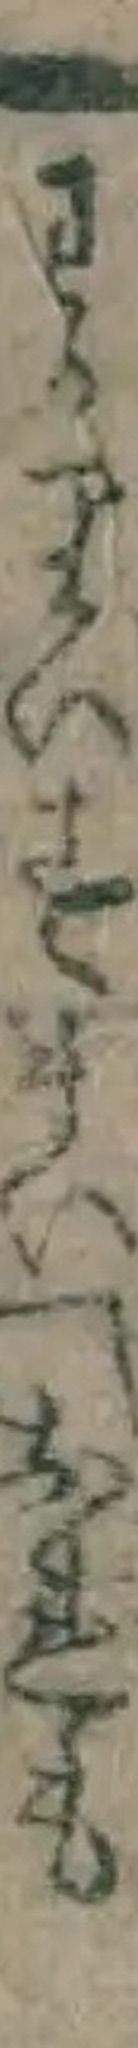わかりいすまい〽おれも
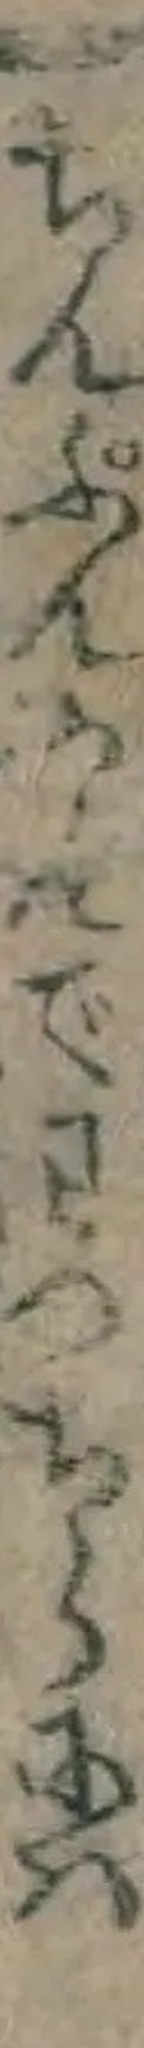ちんぷんかんでわつちらには
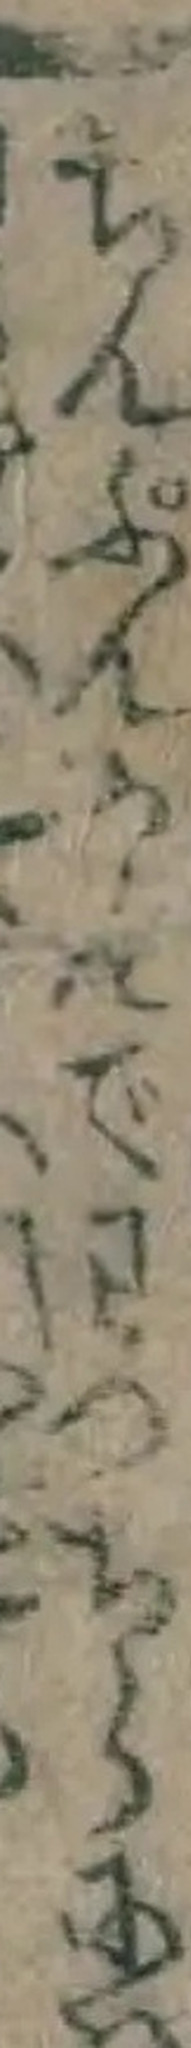ちんぷんかんでわつちらには
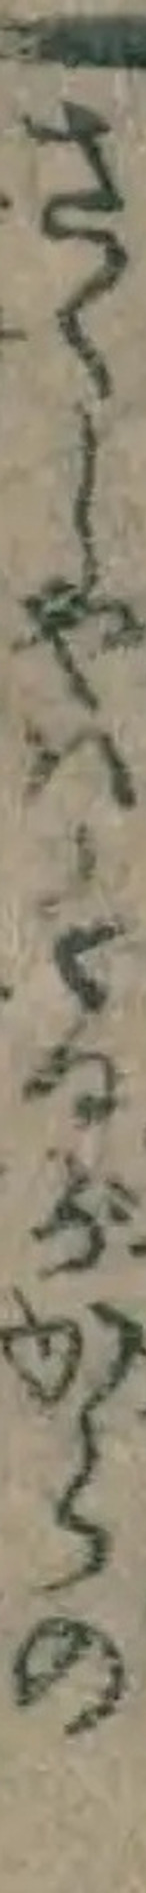さくしやはするがからの
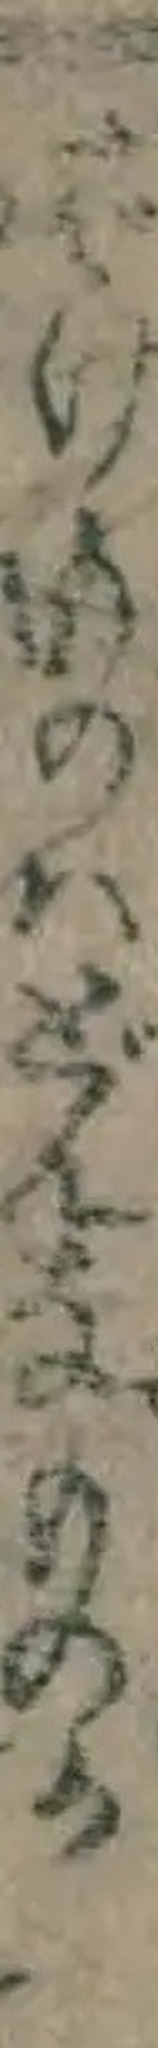ばけものはどんなものか
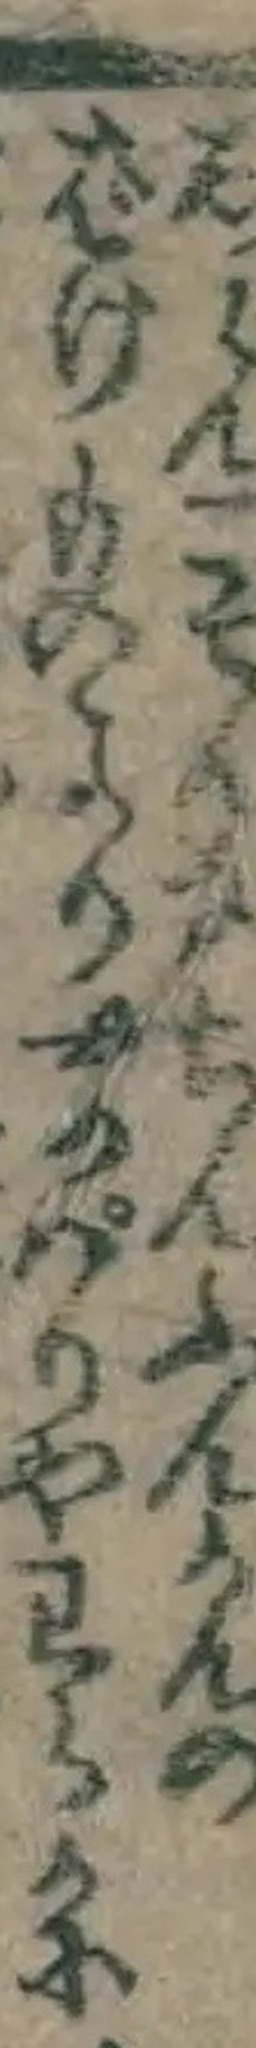ばけものよりやつぱりやわらかに
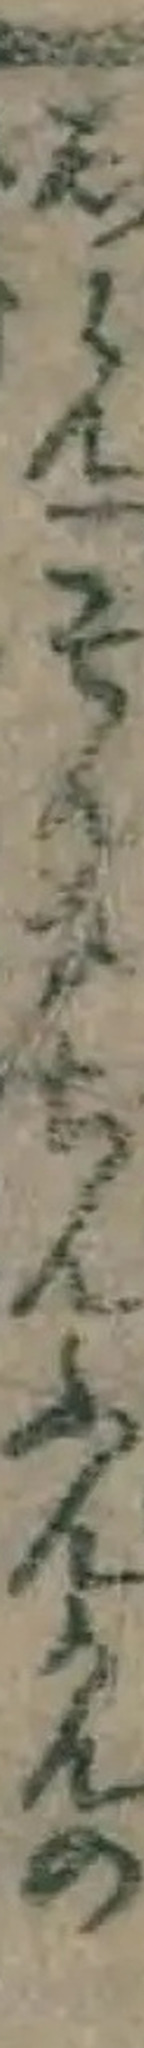しらん〽そんなちんふんかんの
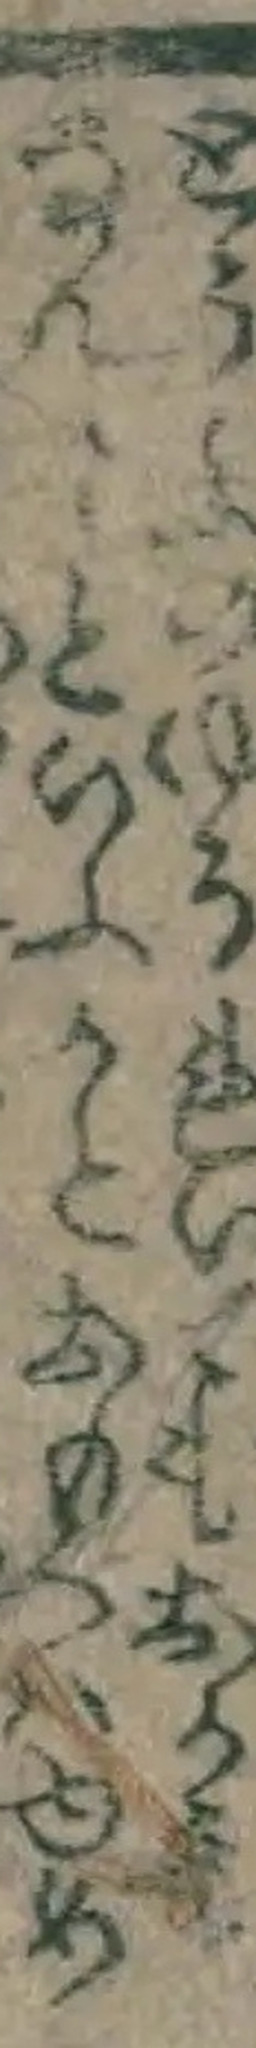なんしといふかとおもへはゆめ
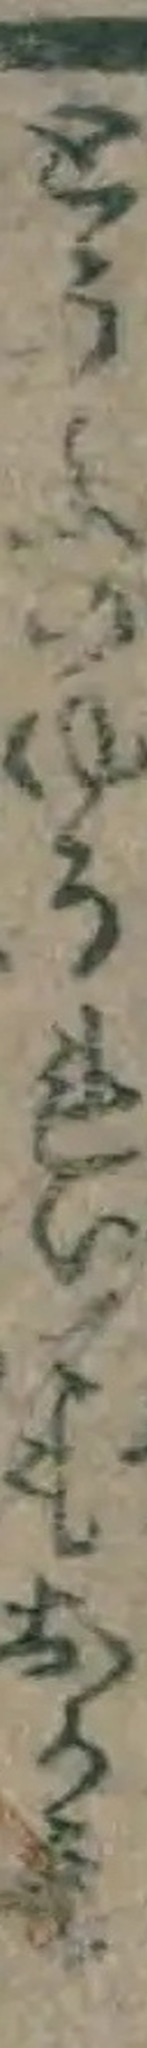とうふのゆうれいてもおかき
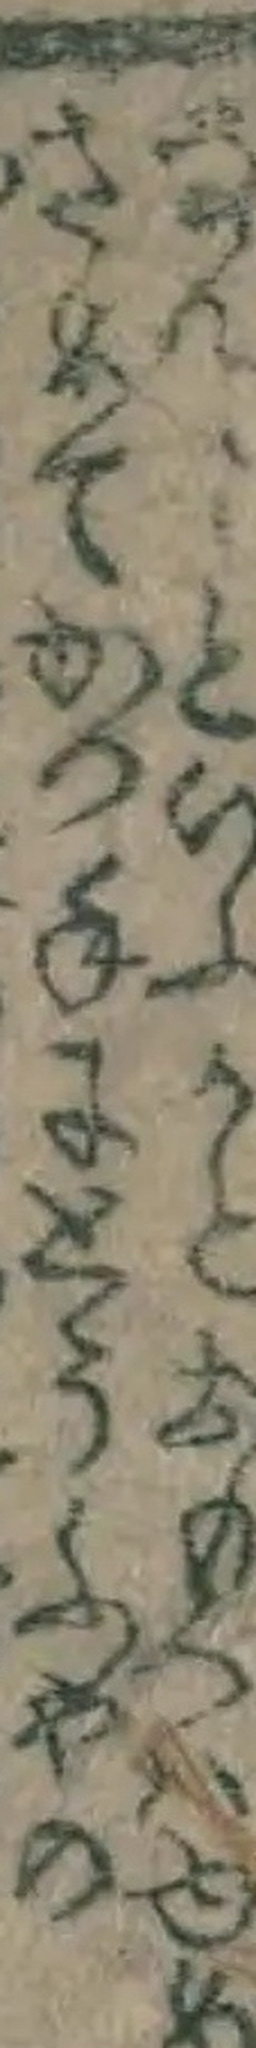さめてかつ手にとうふやの
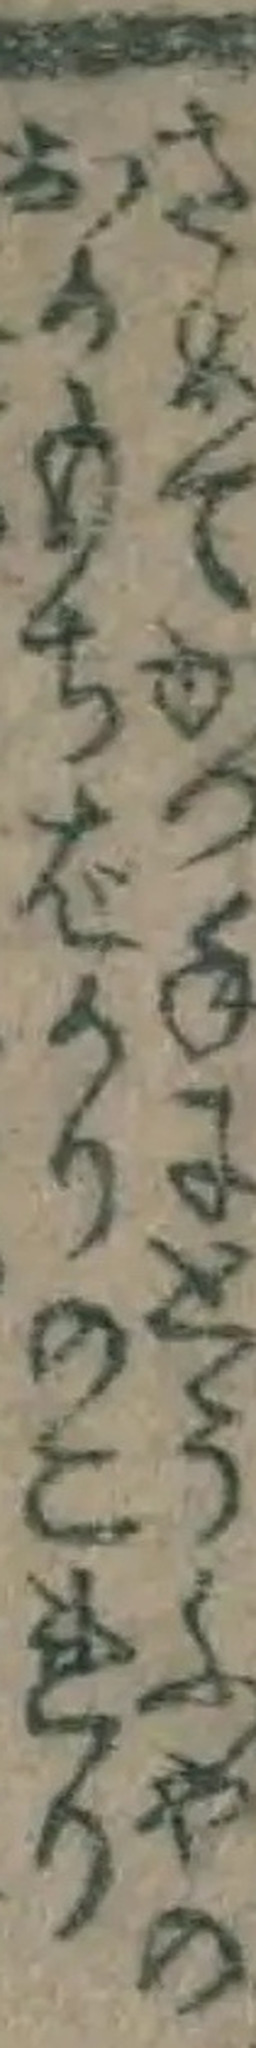おかもちばかりのこれり
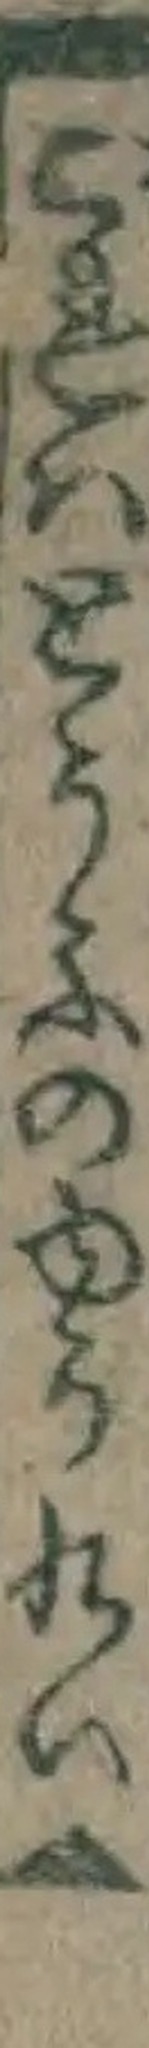これはとうふのゆうれい▲
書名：大時代唐土化物 3巻
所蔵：国立国会図書館 National Diet Library, JAPAN
